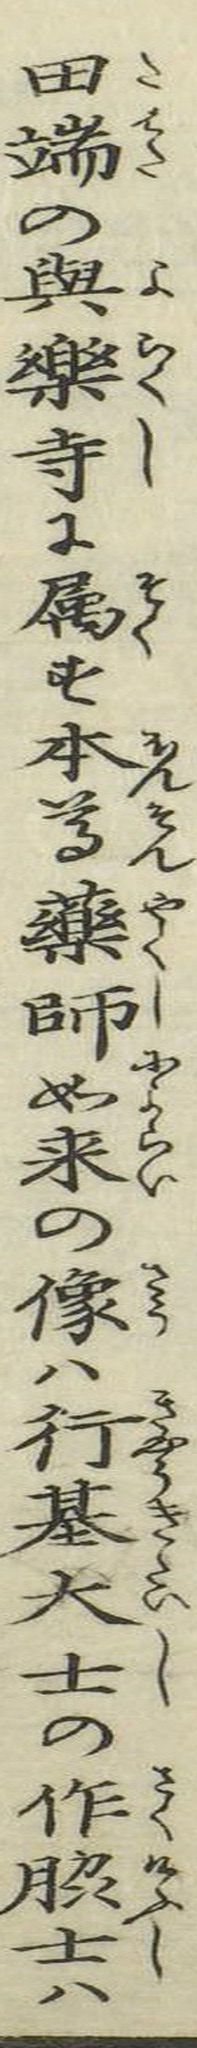田端の与楽寺に属す本尊薬師如来の像は行基大士の作脇士は
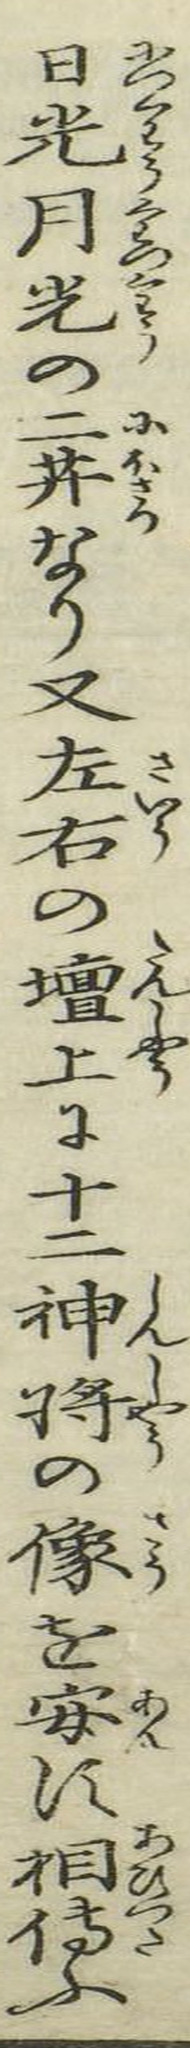日光月光の二菩薩なり又左右の壇上に十二神将の像を安す相伝ふ
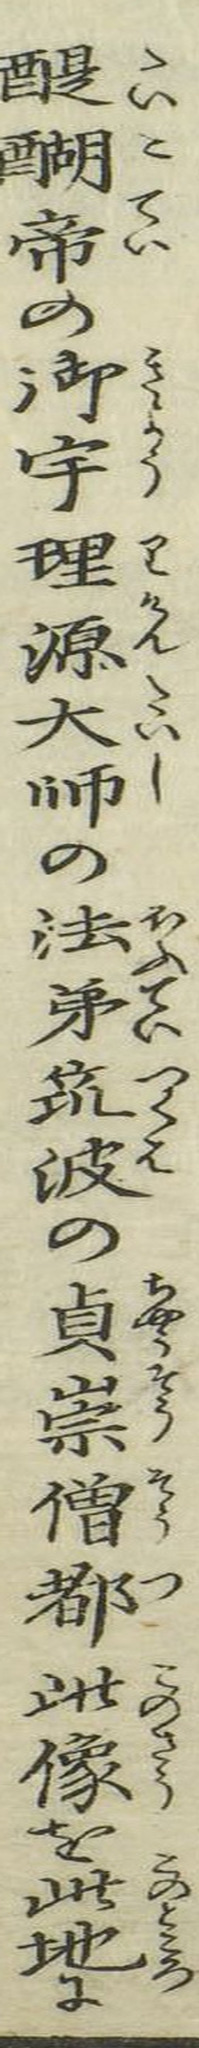醍醐帝の御宇理源大師の法弟筑波の貞崇僧都此像を此地に
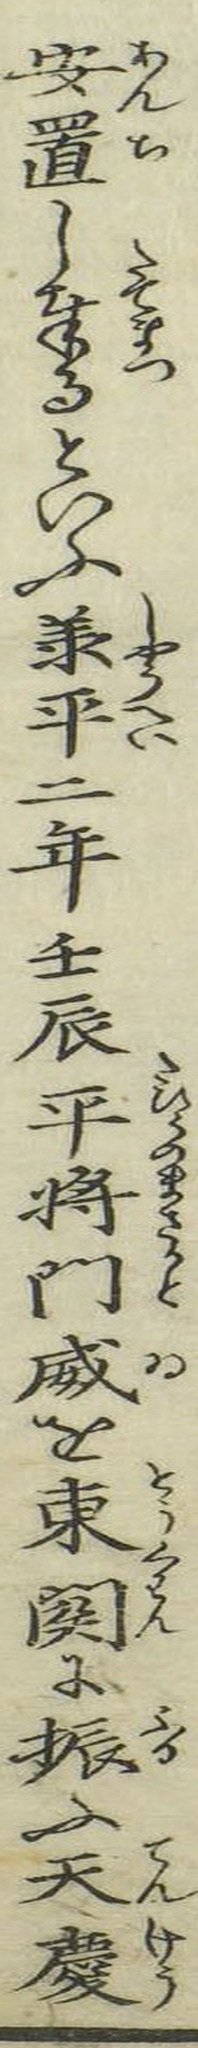安置し奉るといふ承平二年壬辰平将門威を東関に振ふ天慶

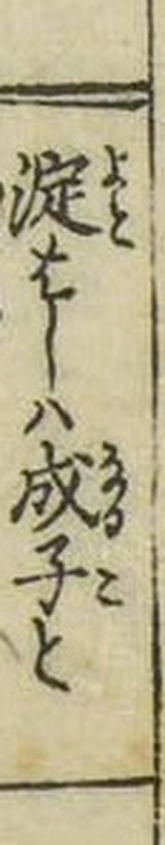淀はしは成子と
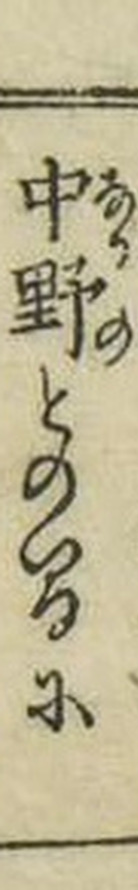中野との間に
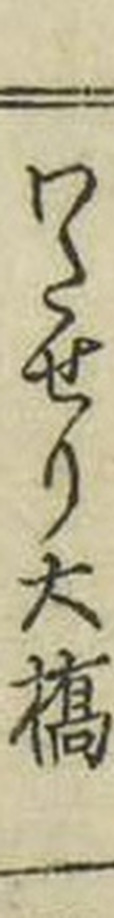わたせり大橋
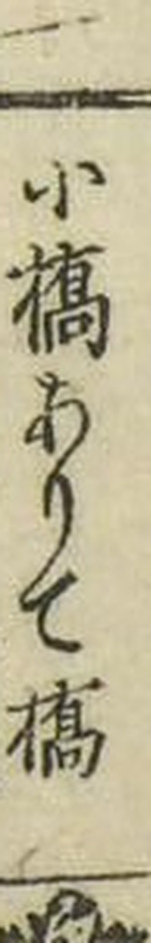小橋ありて橋
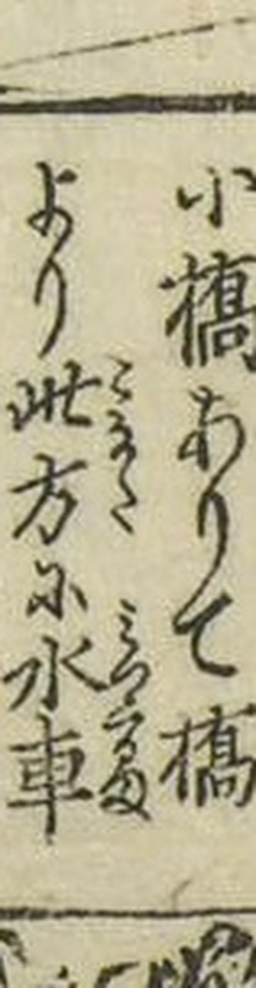より此方に水車
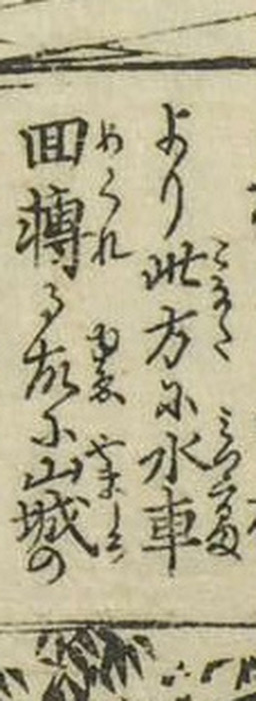回転る故に山城の
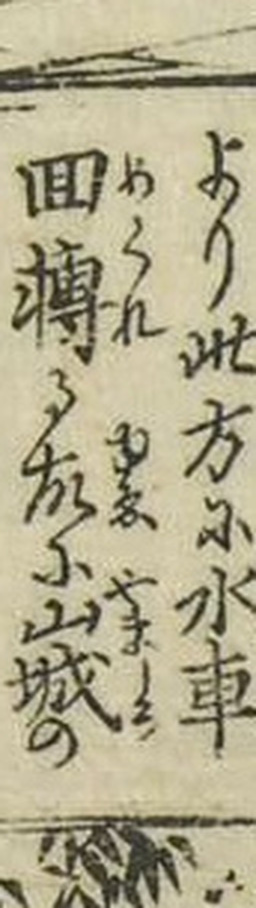回転る故に山城の
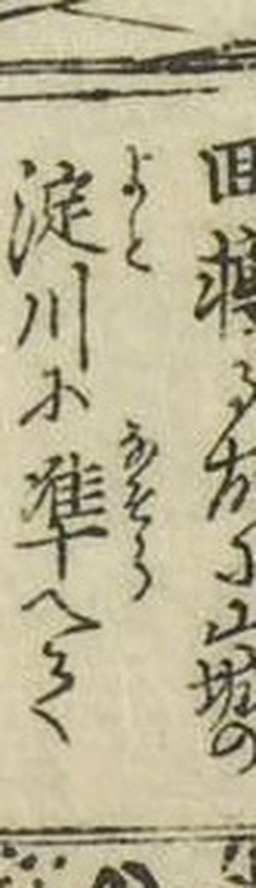淀川に準へて
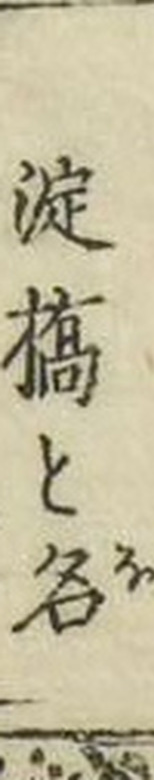淀橋と名
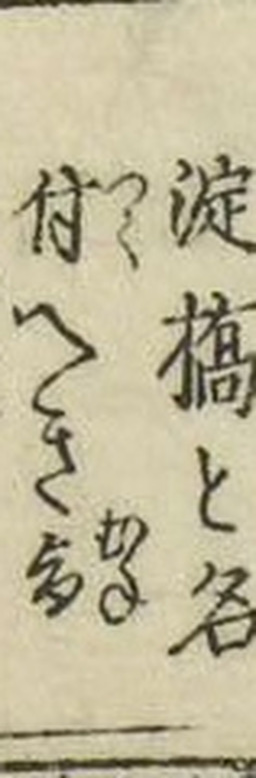付へき旨
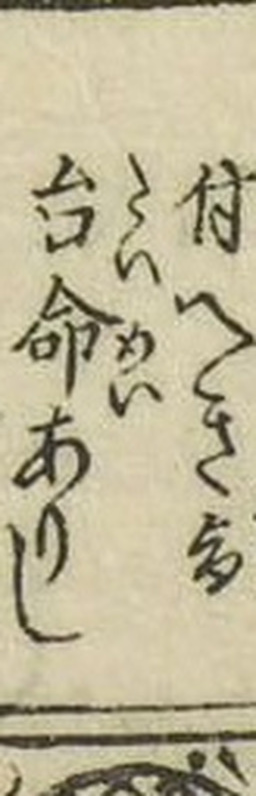台命ありし
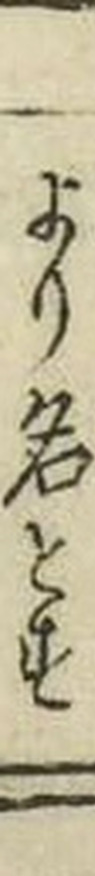より名とす
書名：江戸名所図会 20巻 巻之11
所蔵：東京学芸大学教育コンテンツアーカイブ
